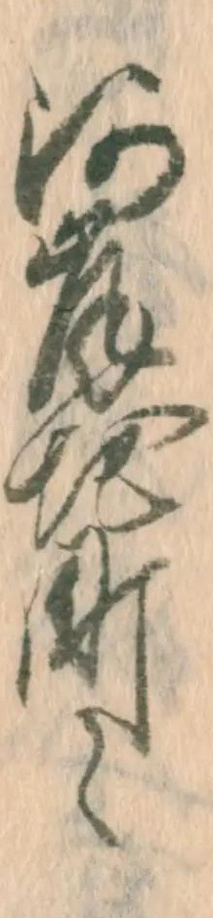河岸地町々
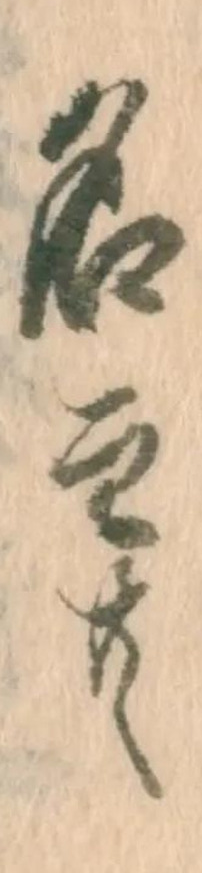名主共
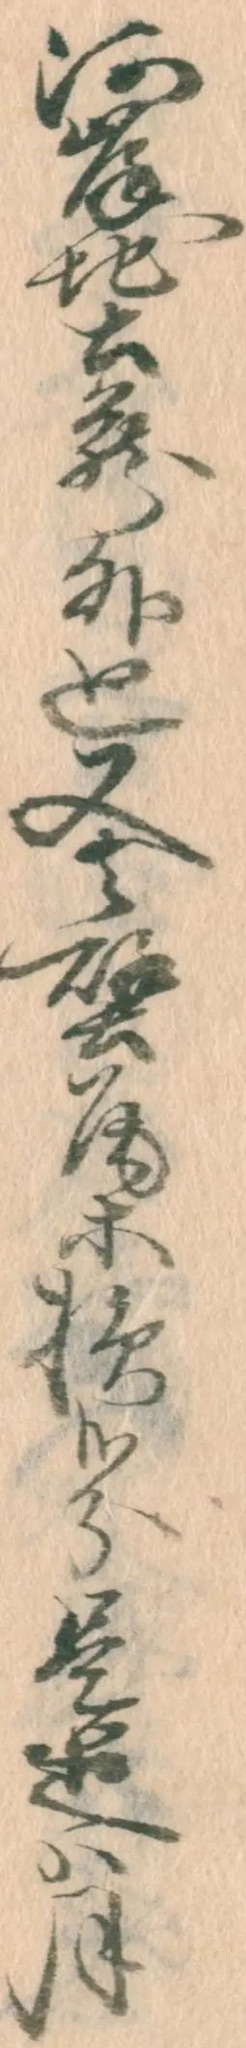河岸地土蔵ノ外廻又は壁瓦等損候分是迄は月
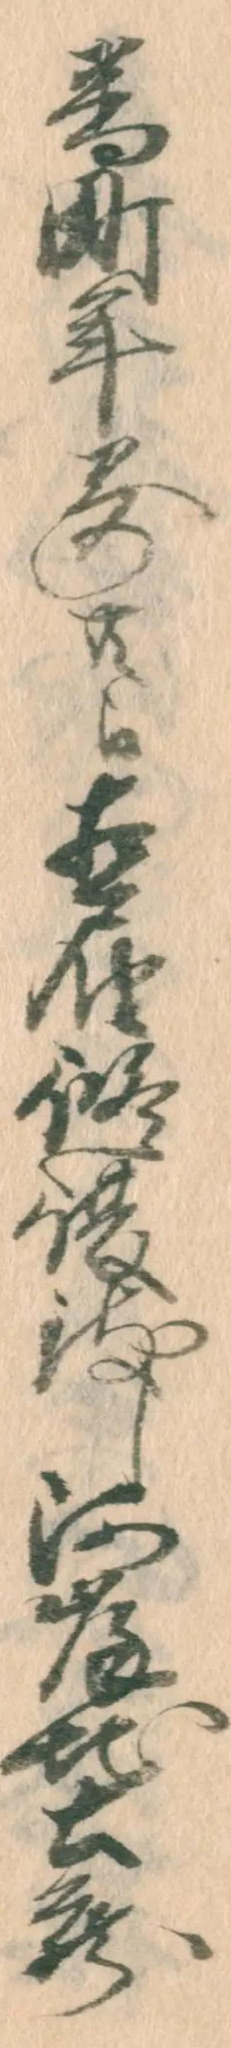番町年寄共え相届修復致し河岸地土蔵
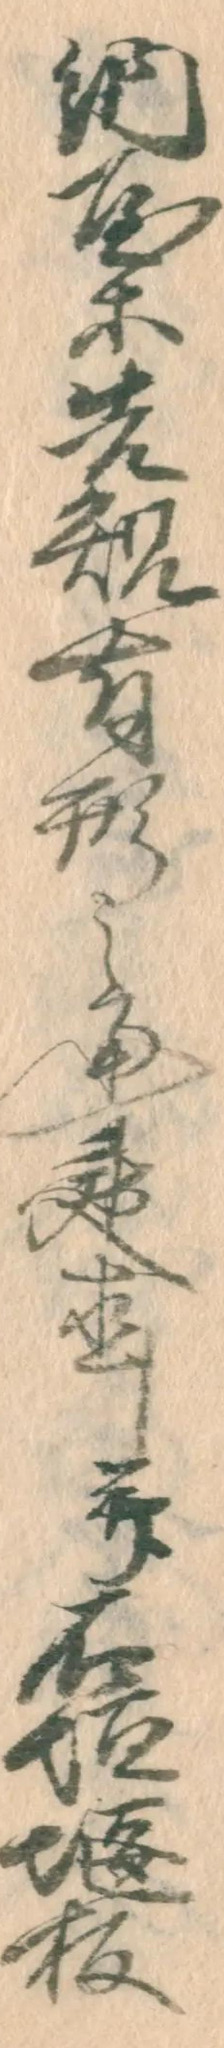納屋等先規有形之通建直し幷石垣堰板
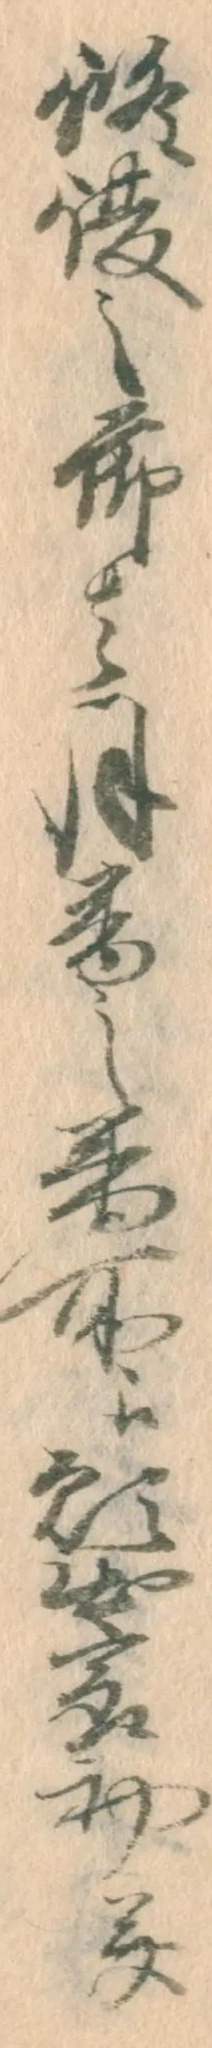修復之節は月番之番所え願出最初幷

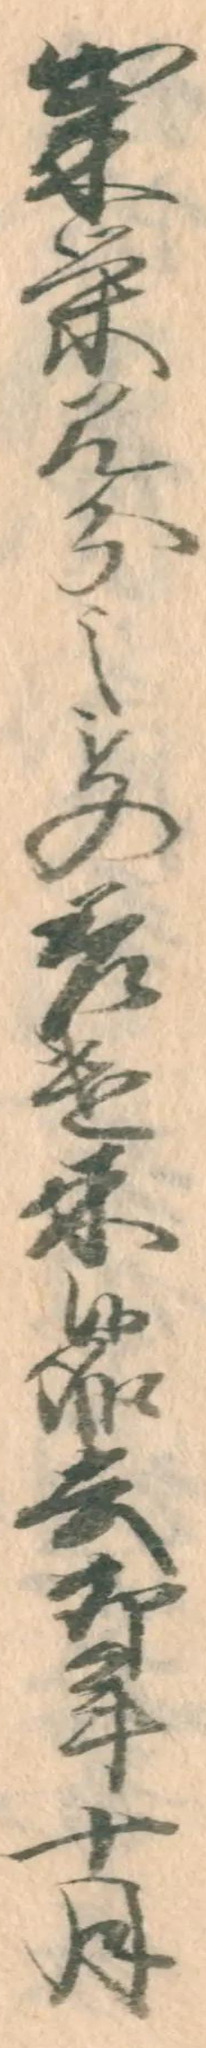出来栄見分之もの差遣来候処去卯年十月
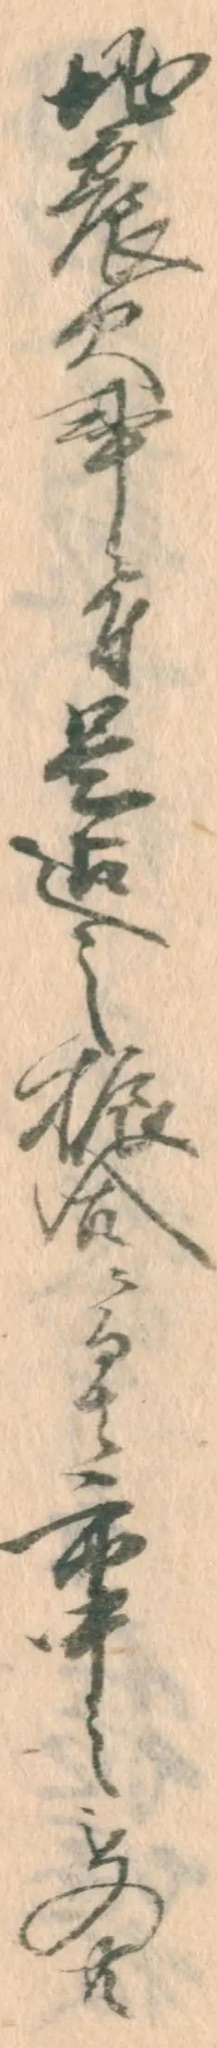地震火事ニ付是迄之振合ニ而は市中之もの共
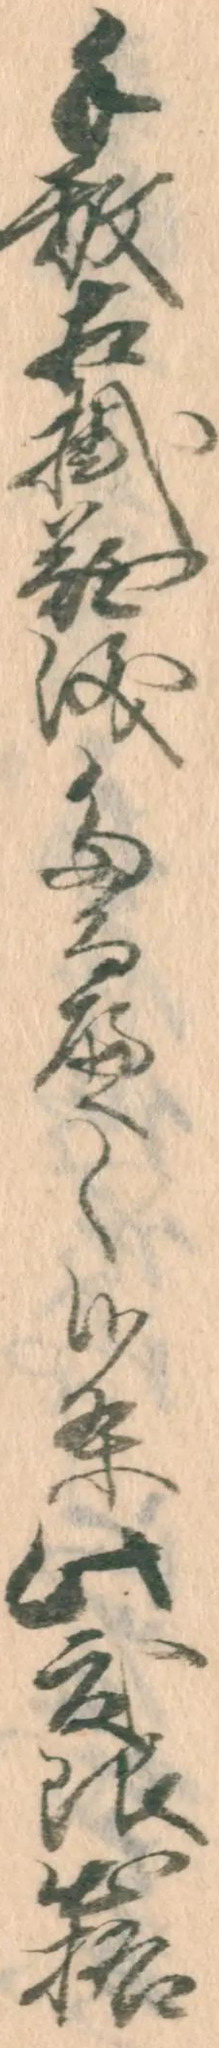手数相掛難儀たるへく候条此度限出格
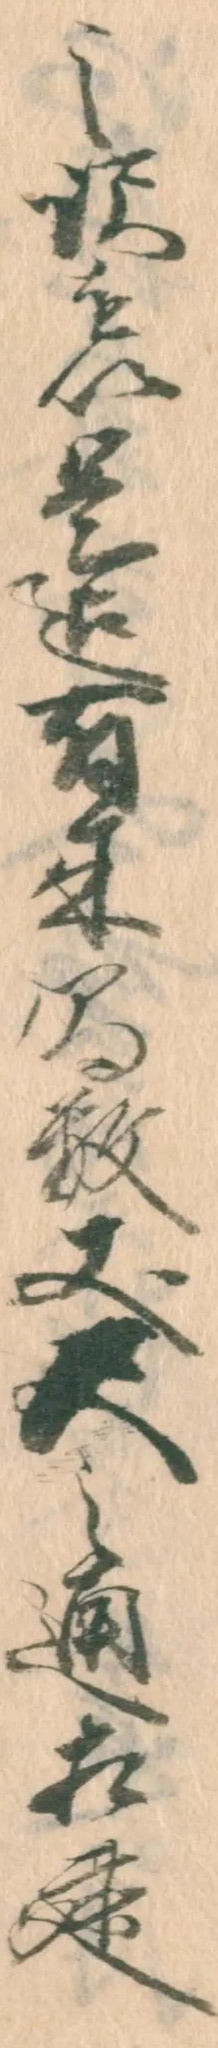之訳を以是迄有来間数丈尺之通相建
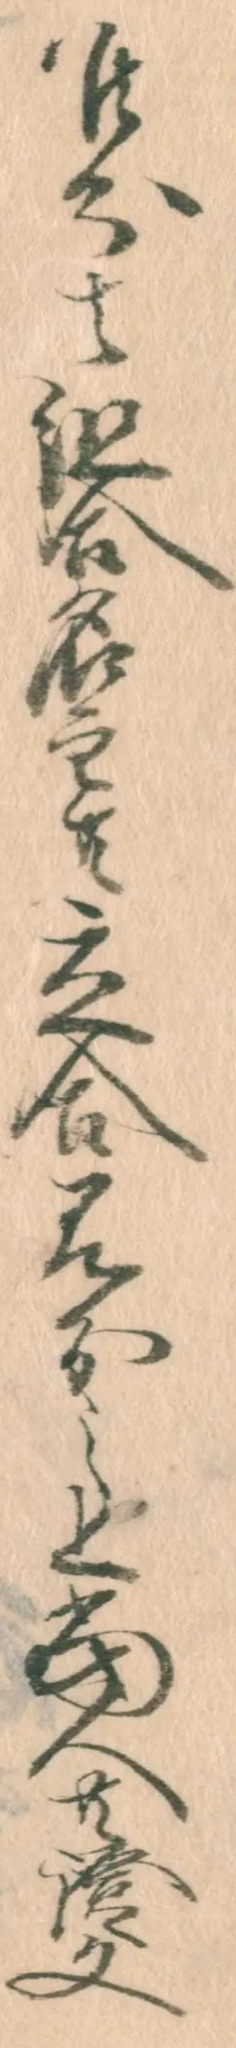候分は組合名主共立合見分之上当人共証文
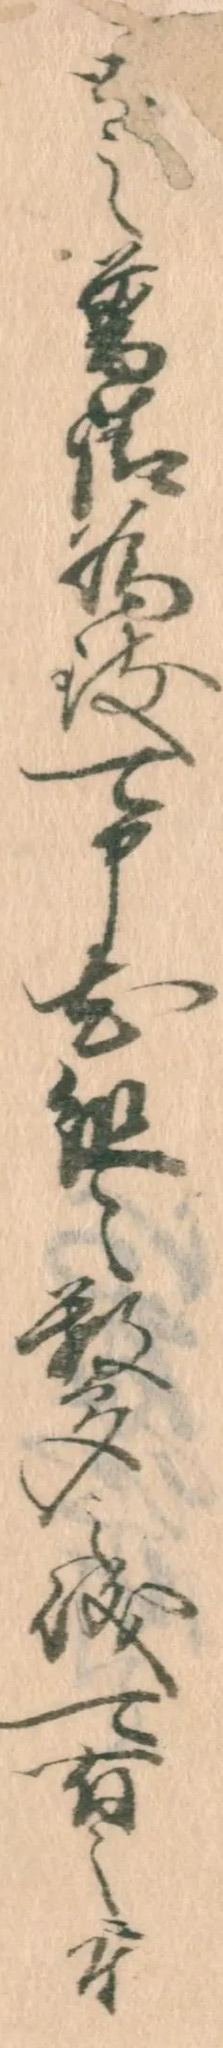取之普請為致可申尤組々数多之儀可有之ニ付
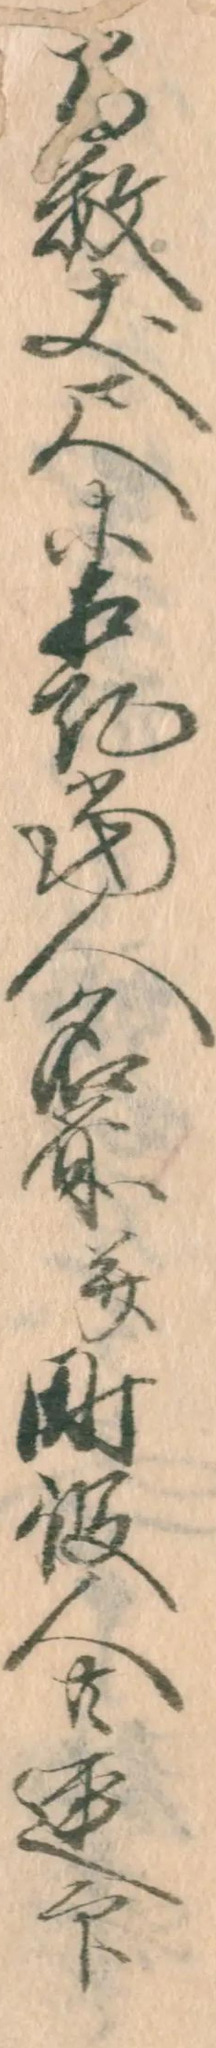間数丈尺等相糺当人名前幷町役人共連印
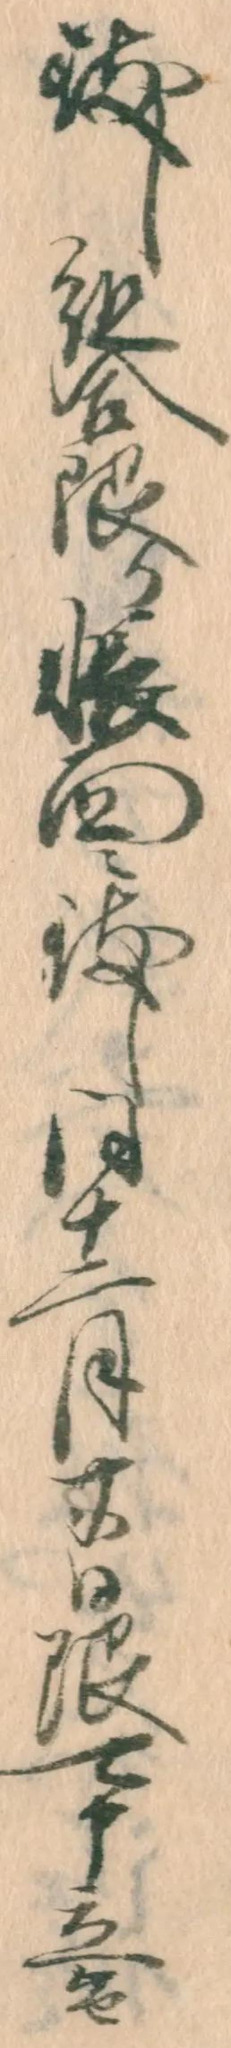致し組合限リ帳面ニ致し同十二月廿日限可申立置
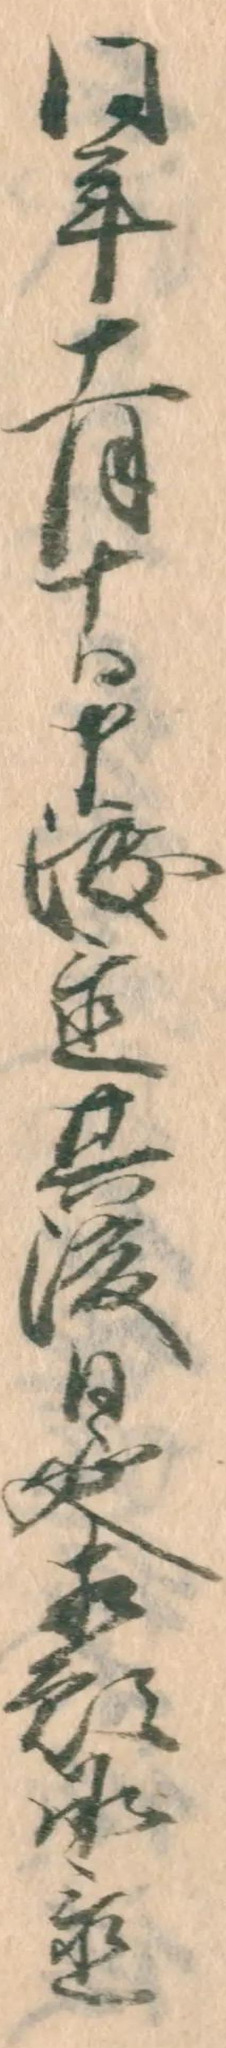同年十一月十日申渡置其後日延相願承置
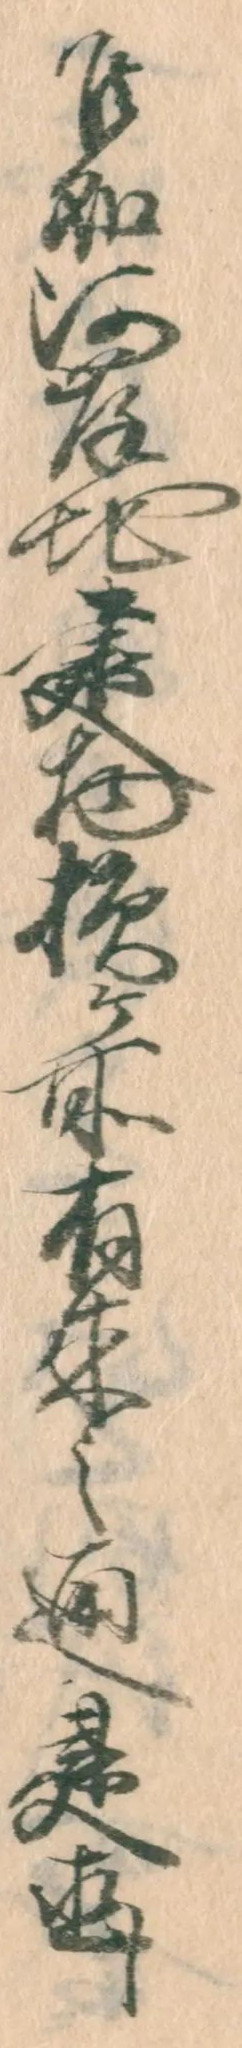候処河岸地建物損ヶ所有来之通建直し
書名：地震災書留 2巻. [1] 内表紙に「地震災書留　安政二卯年　但本所深川御用屋敷地代免除調」とあり
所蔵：国立国会図書館 National Diet Library, JAPAN
